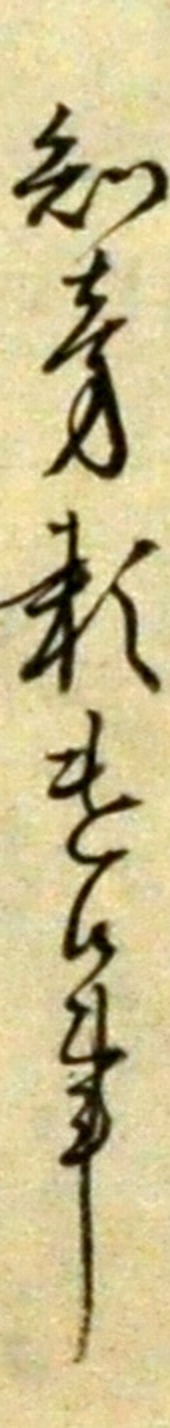知旁頼遣候事
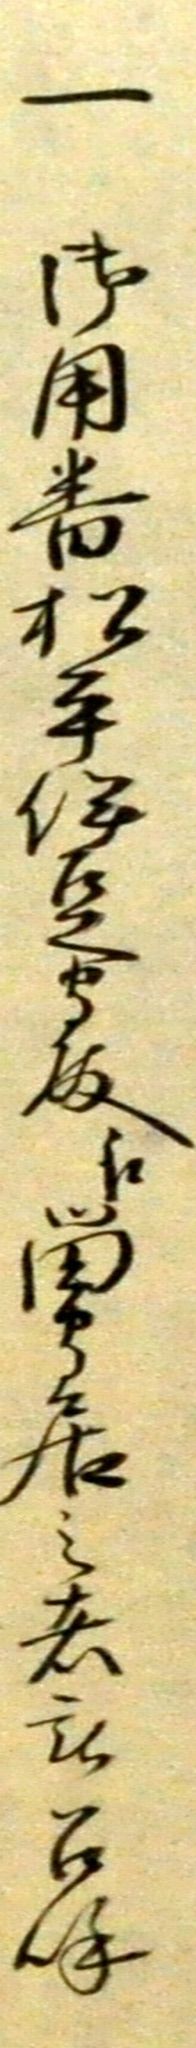一御用番松平伊豆守殿江留守居之者被召呼
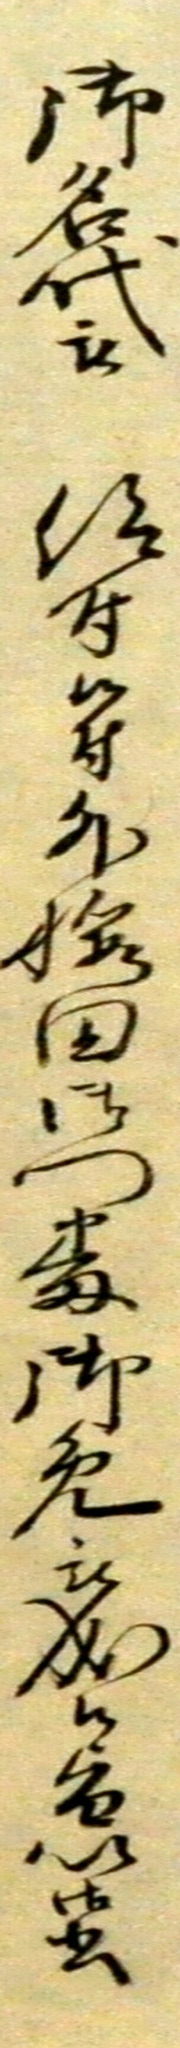御名代被仰付候付外櫻田御門番御免被成候旨以御書
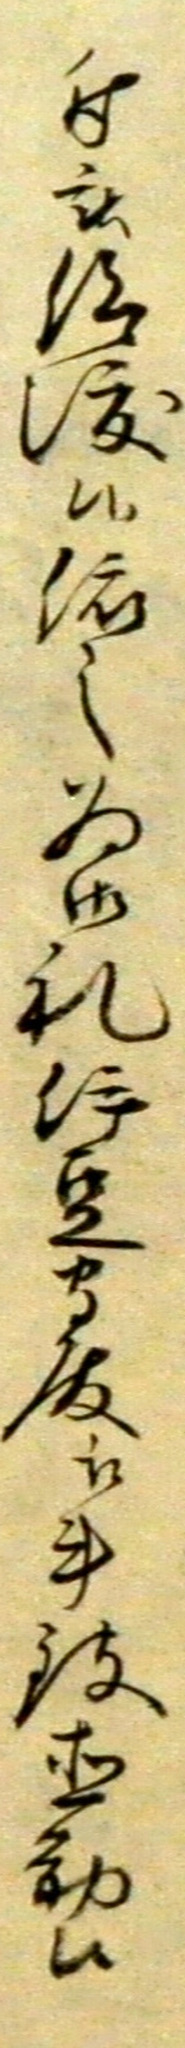付被仰渡候依之為御礼伊豆守殿江書致直勤候

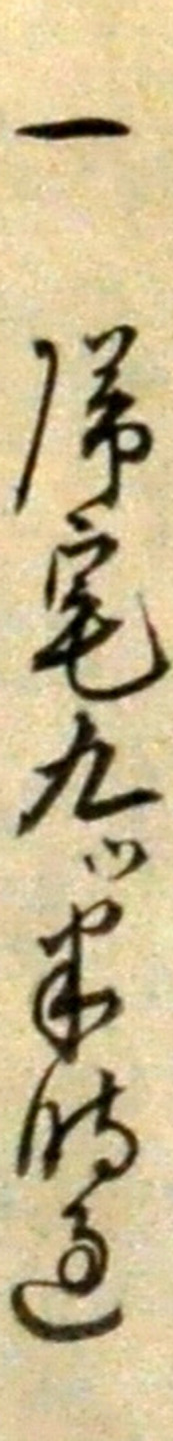一帰宅九ッ半過
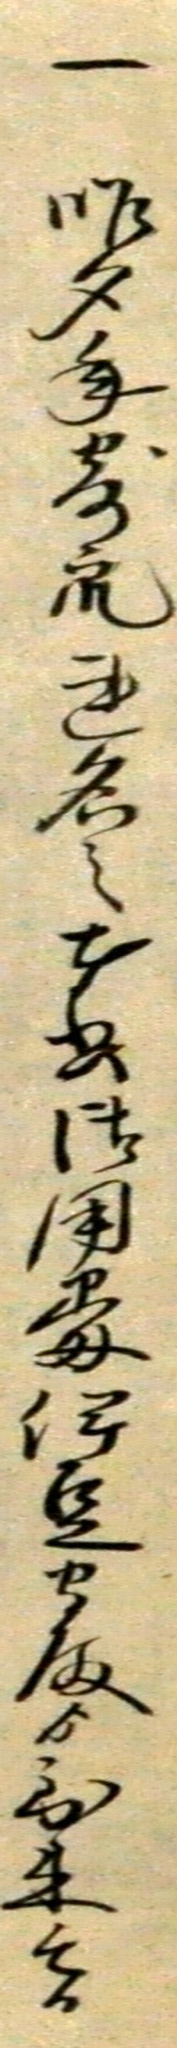一昨夕年寄衆連名之奉書御用番伊豆守殿ゟ到来今日
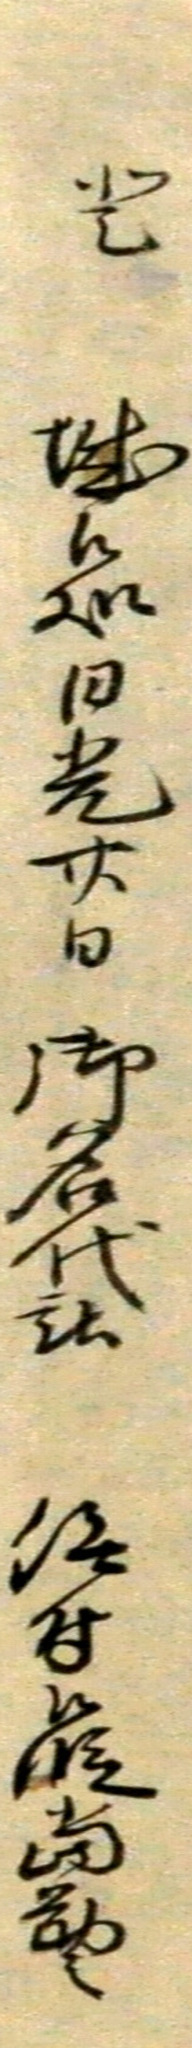登城候処日光廿日御名代被仰付候段當勤之
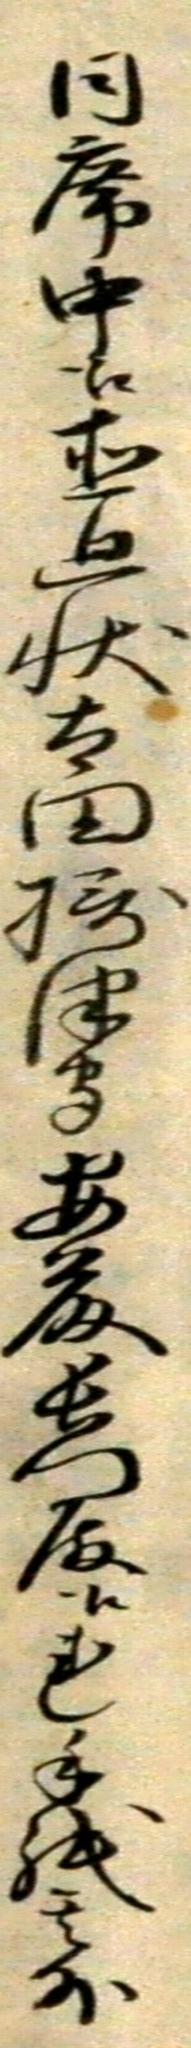同席中江直廻状太田攝津守安藤長門殿江も手紙其外
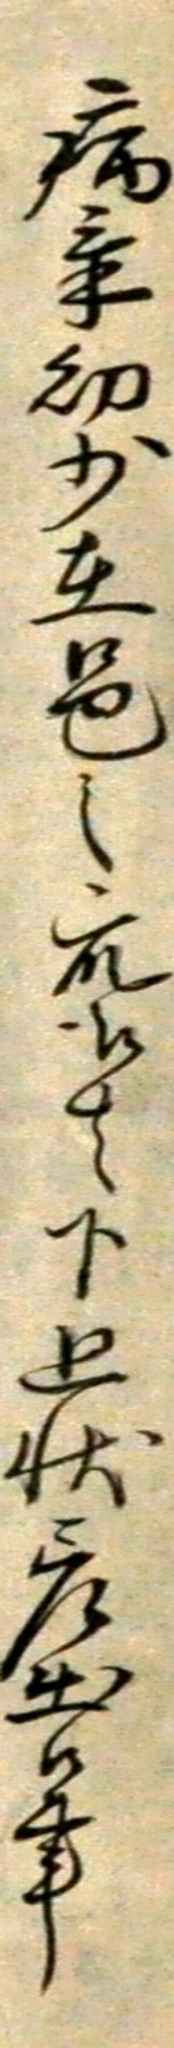病気幼少在邑之衆江者下廻状差出候事
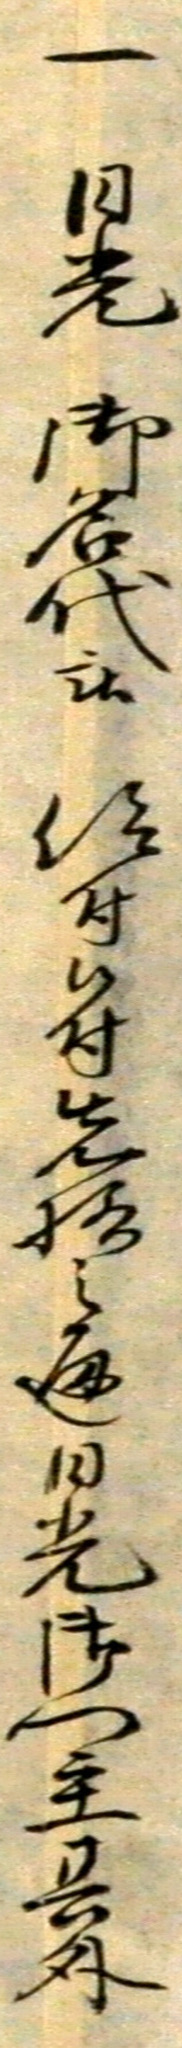一日光御名代被仰付候付先格之通日光御門主其外
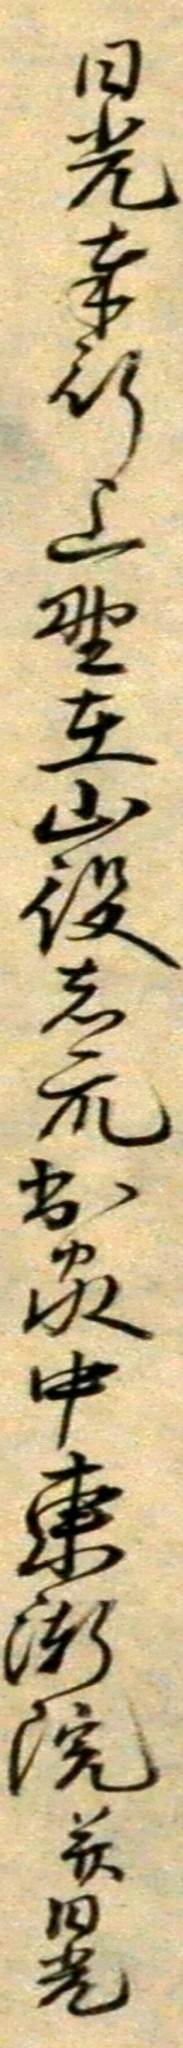日光奉行上野在山役者衆出家中東漸院幷日光
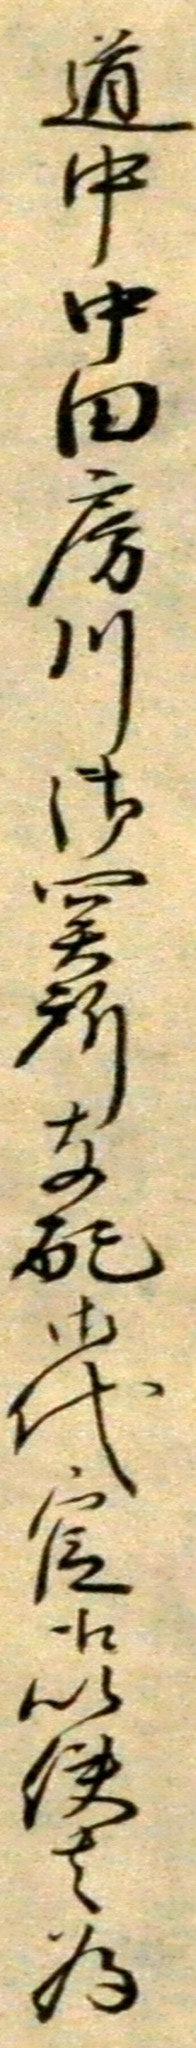道中中田房川御関所支配御代官江以使者為
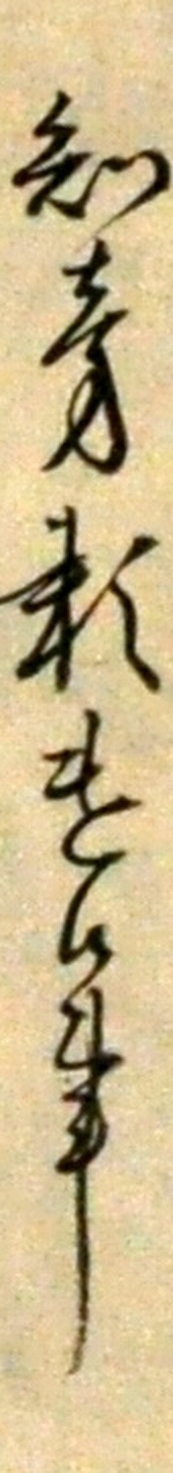知旁頼遣候事
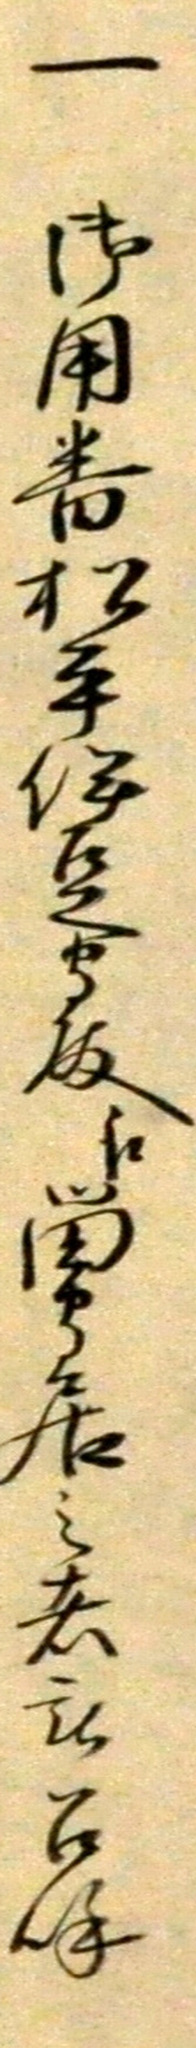一御用番松平伊豆守殿江留守居之者被召呼
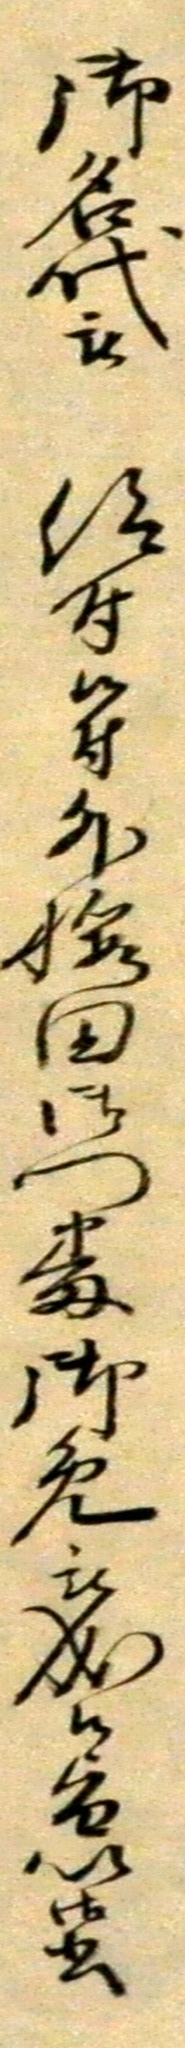御名代被仰付候付外櫻田御門番御免被成候旨以御書
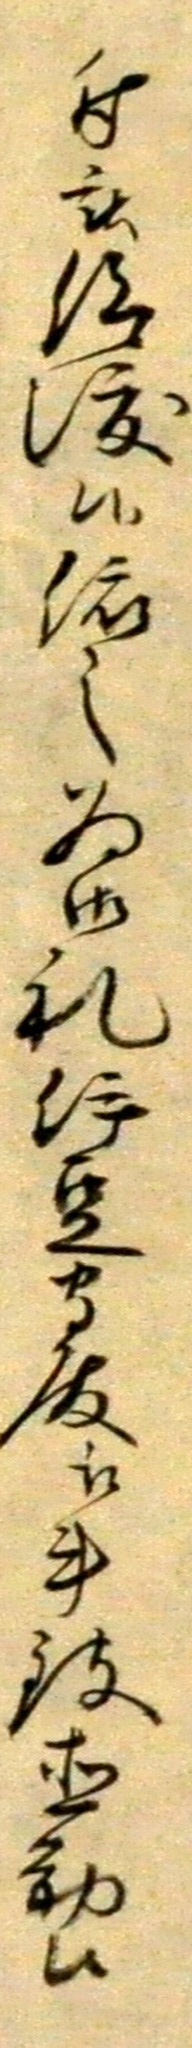付被仰渡候依之為御礼伊豆守殿江書致直勤候
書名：日光御名代相勤候節ノ留
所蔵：伊那市立高遠町図書館・合同会社AMANE
